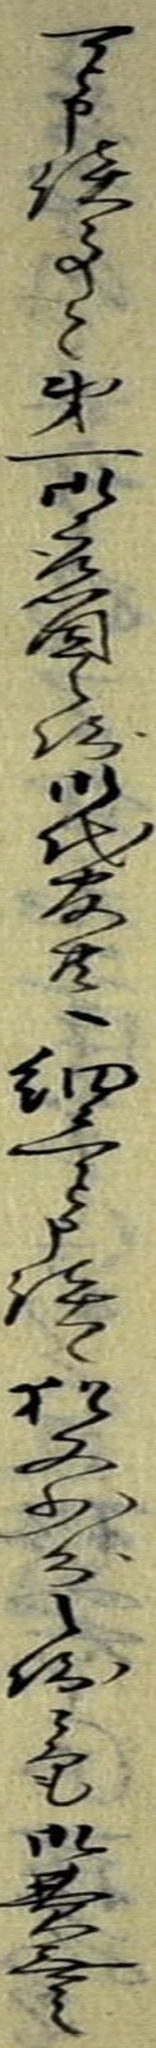可被申談事に候第一御取箇之儀御代官共へ細々可被申談候猶又少分之儀に而も御費無之
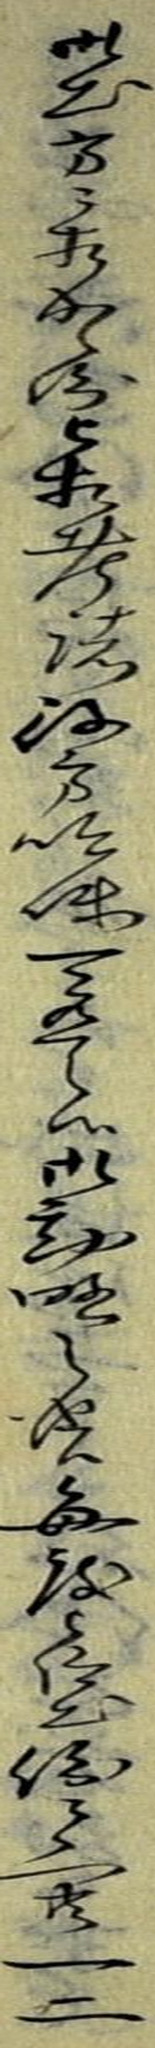御出方に相成候儀被相考諸役方吟味可有之候御勘略之儀は毎度被仰出儀に候へ共一二
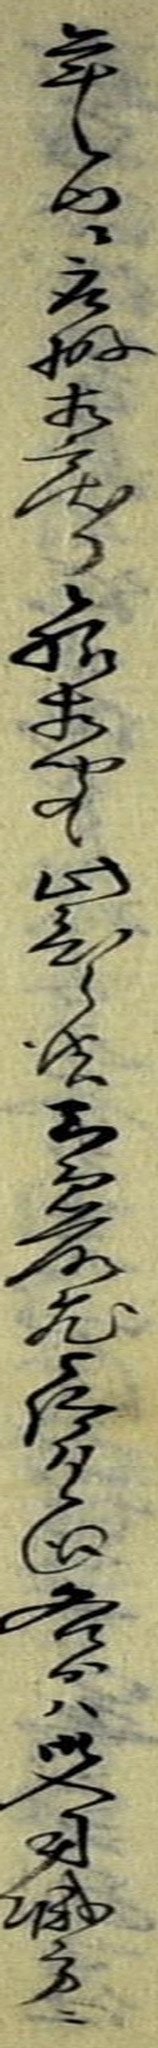年之内に取扱相戻り候様相聞候此度之儀は至而厳敷被仰付候趣各ゟは御入用減方に
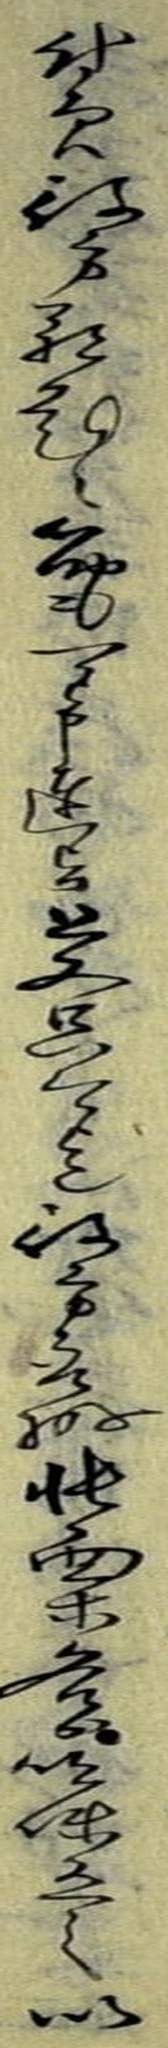付而は役方難題之筋も可被申達旨且又只今迄役方取扱帳面等各ゟ吟味有之以
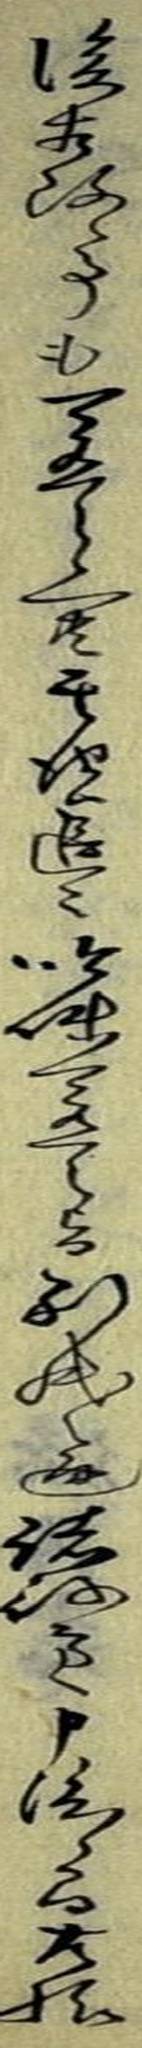後相改候事も可有之候へ共其儀は追々吟味可有之旨別紙之通諸役方へ申渡候間左様
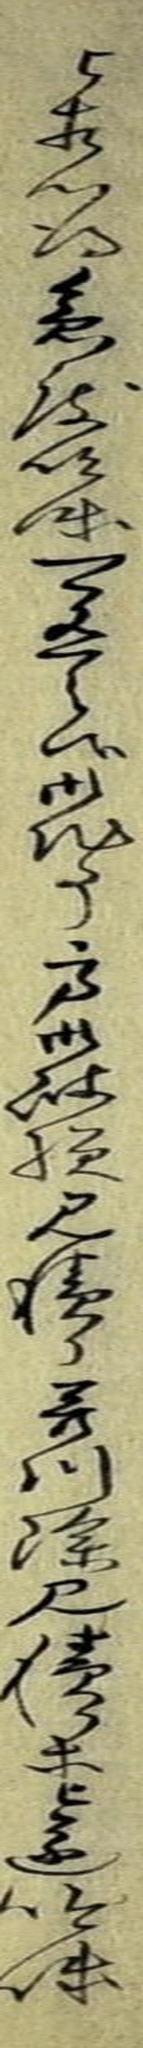被相心得急度吟味可有之候御作事方御破損見積り并川除見積り等被遂吟味
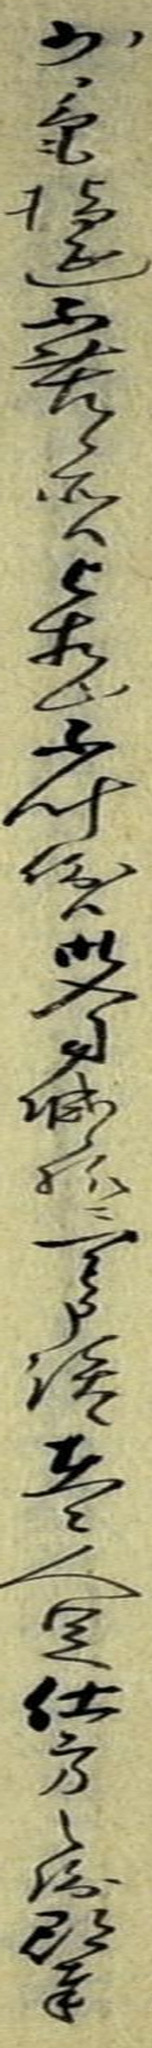少に而も指延不苦候所は被相止不叶儀は御入用減候様に可被申談候在々人足仕方之儀郡奉
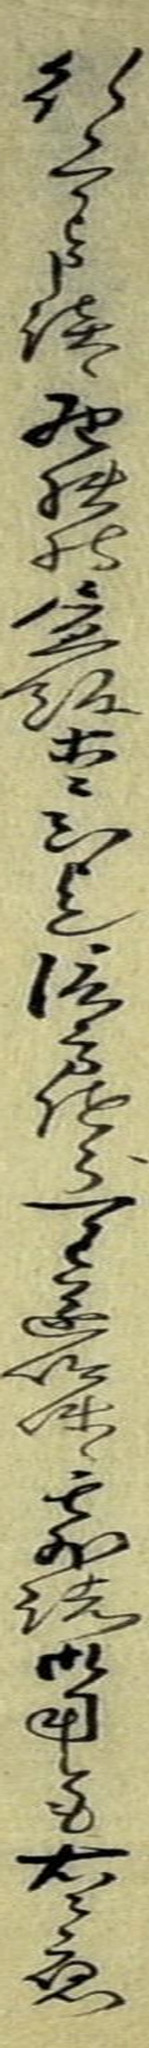行へ可被申渡候野扶持昼飯等に至迄渡方随分可被遂吟味候其外諸御用とも右に応
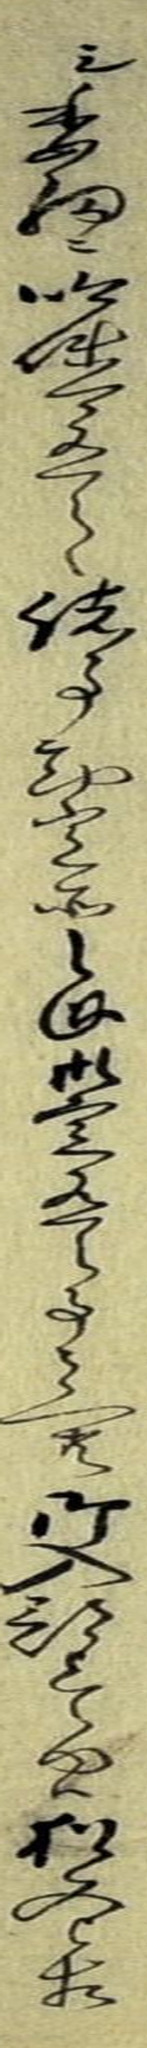し委細に吟味可有之候諸事勘定所之趣御定有之事に候へ共御入部迄之内は猶又被相
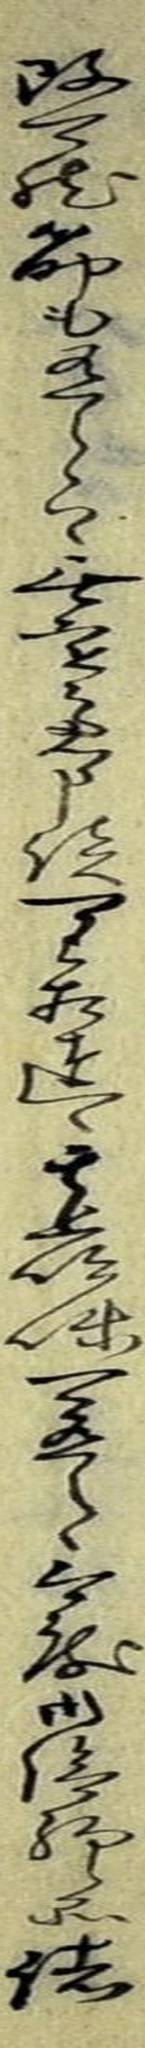改可然筋も有之候はゝ無遠慮申談可被相達候其上吟味可有之候今度御倹約之品諸
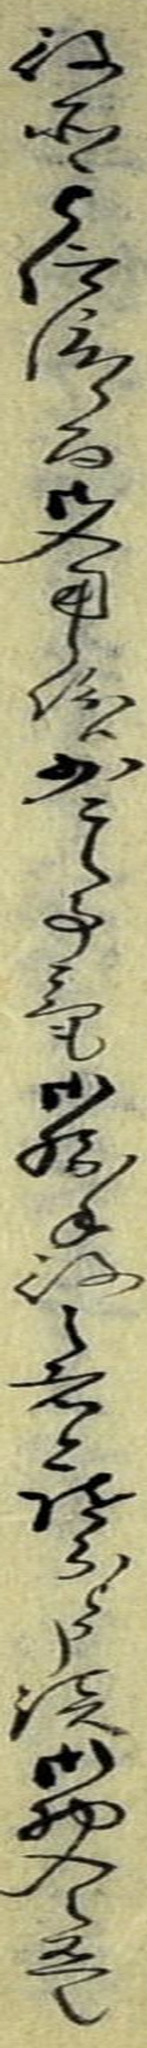役所へ被仰渡候間御入用之儀は少々之事に而も御勝手役之者と随分被申談御物入有之
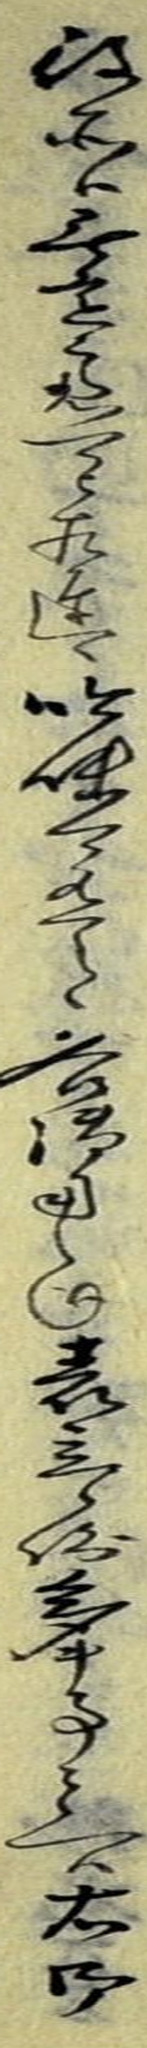役所は無遠慮可被相達候吟味可有之候各御用之趣表立候儀多き事に候へは右御
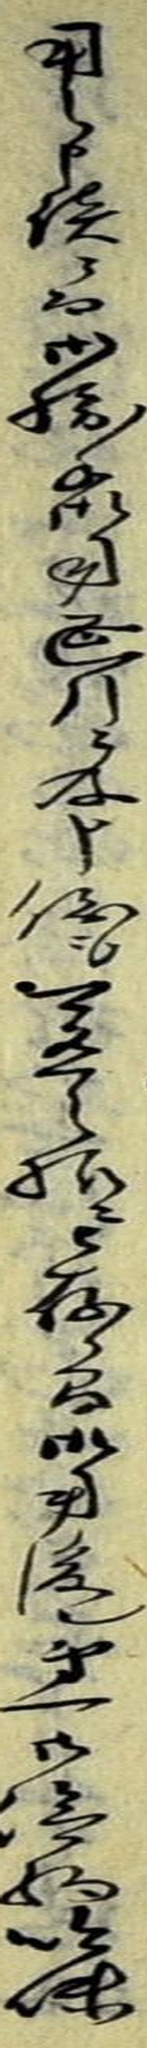用之申談に而御勝手御用延引に及申儀も可有之様に被存候間御用後れ第一御倹約吟味
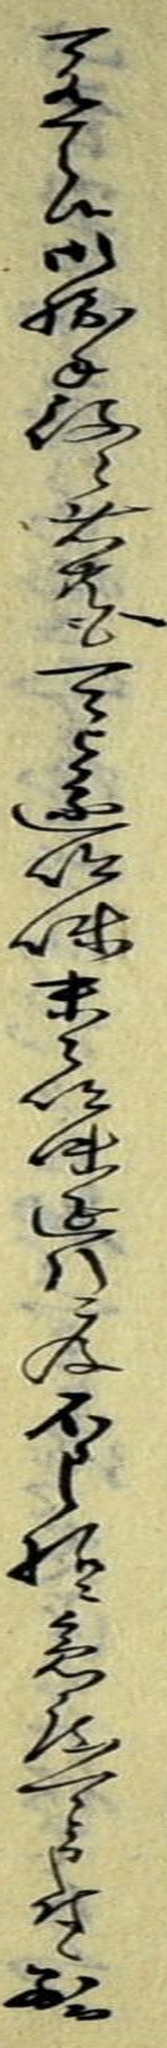可有之候御勝手役之者共へも可被遂吟味末々吟味延引に及不申様に急度可被申付候別而

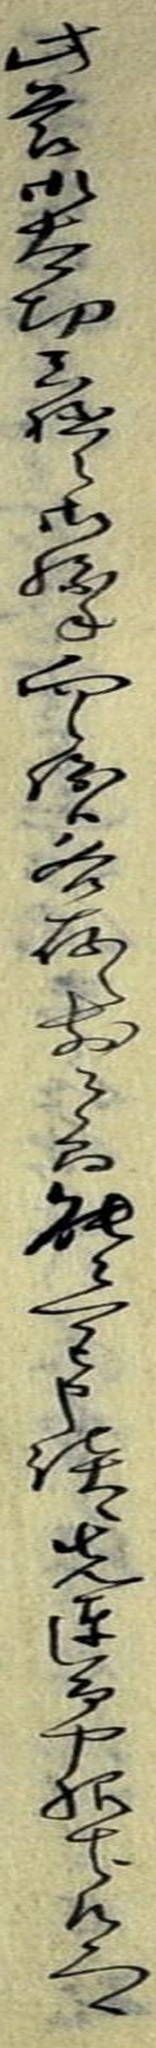此節御太切至極之御勝手向之儀は各存之前に候間能々可被申談候先達而中根十郎左衛門へ
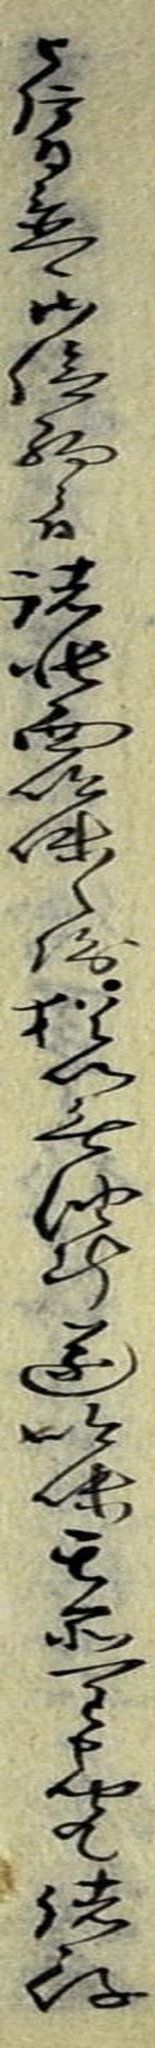被仰付置候御倹約に付諸帳面吟味之儀猶以無油断遂吟味其品可被申聞候諸役
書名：命令之部 二
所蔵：福井県文書館 Fukui Prefectural Archives
